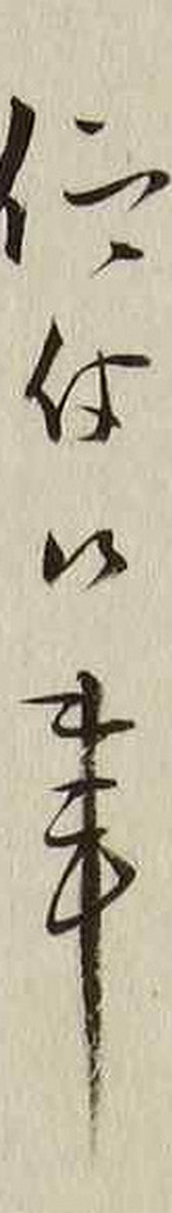仰付候事
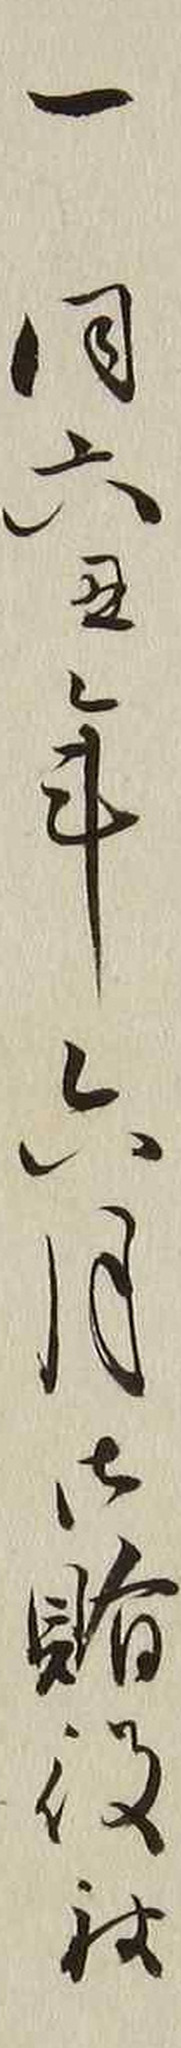一同六丑年六月御賄役被
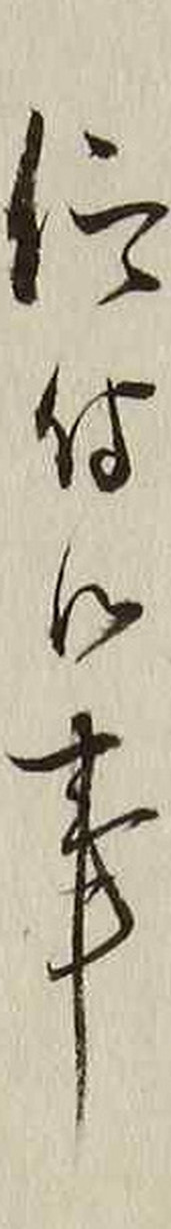仰付候事
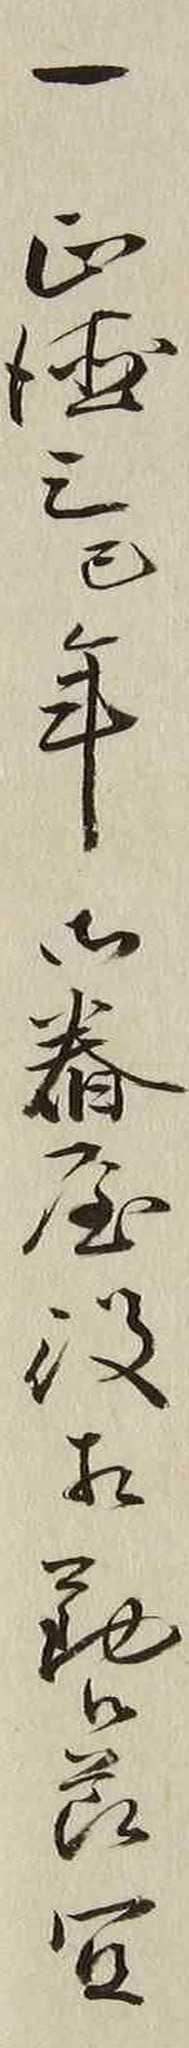一正徳三巳年御舂屋役相勤候節宜
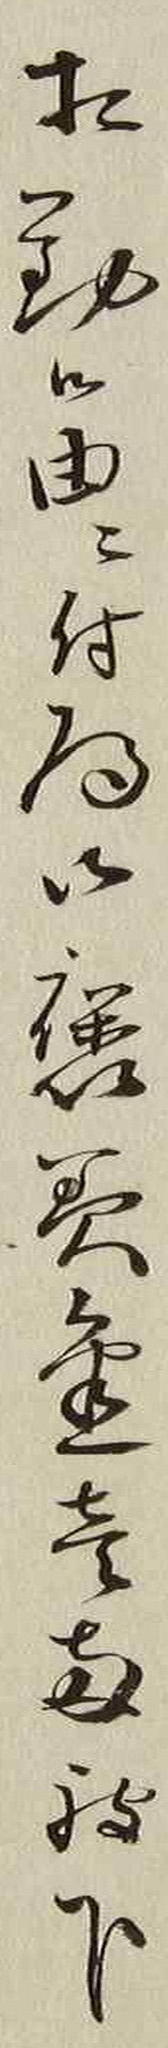相勤候由ニ付為御褒美金壱両被下
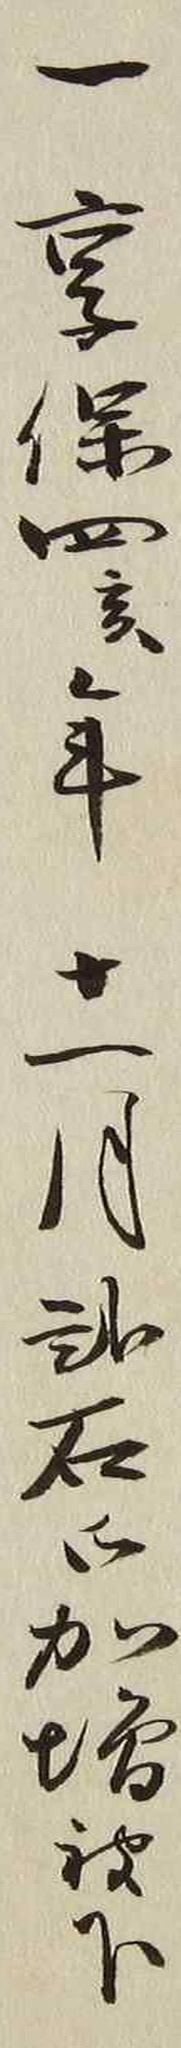一享保四亥年十一月弐石御加増被下
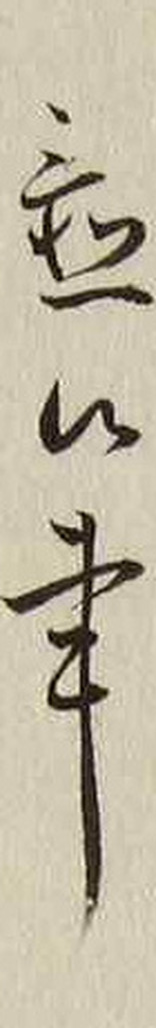置候事
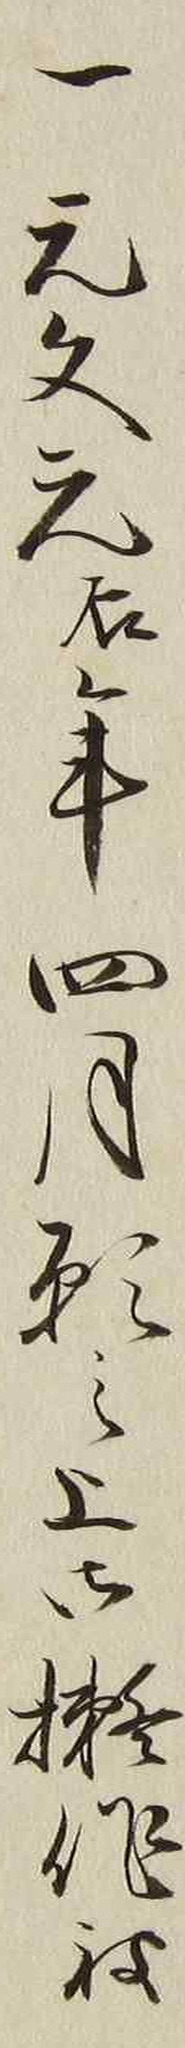一元文元辰年四月願之上御擬作被
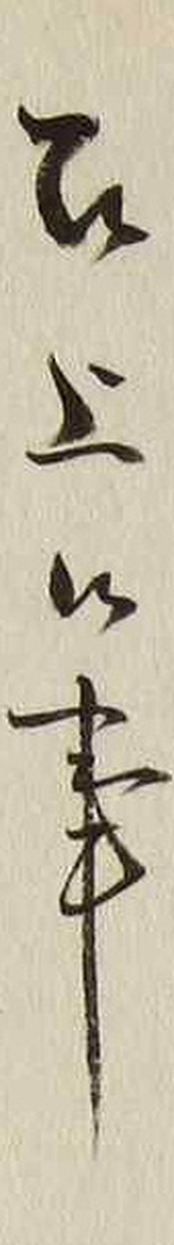召上候事
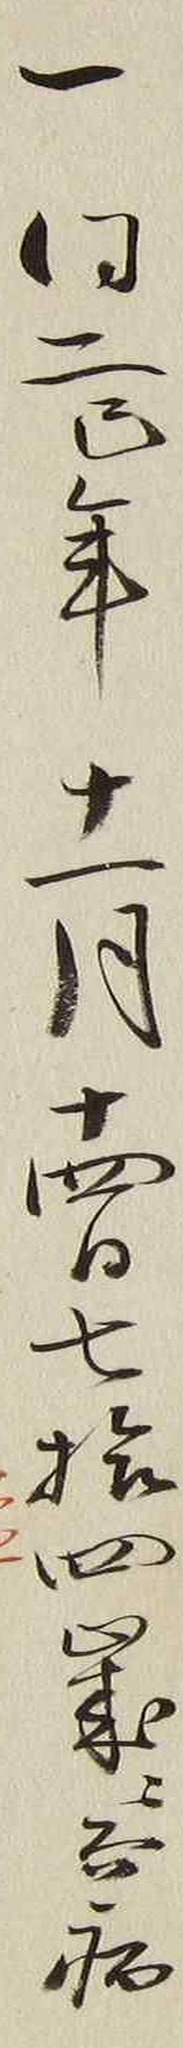一同二巳年十一月十四日七拾四歳ニ而病

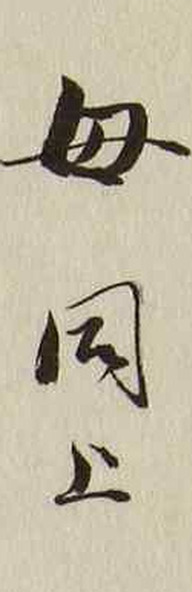母同上
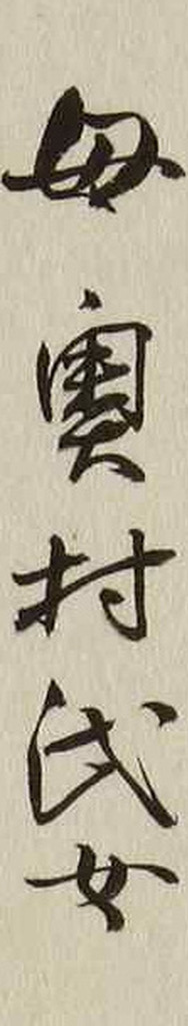母奥村氏女
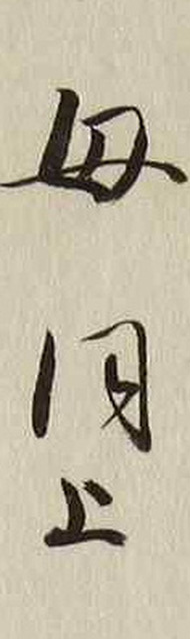母同上
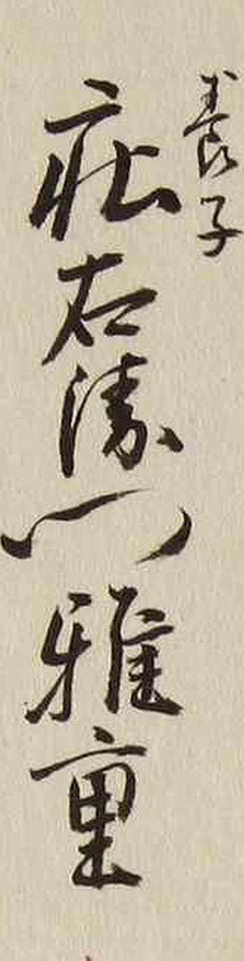庄右衛門雅重
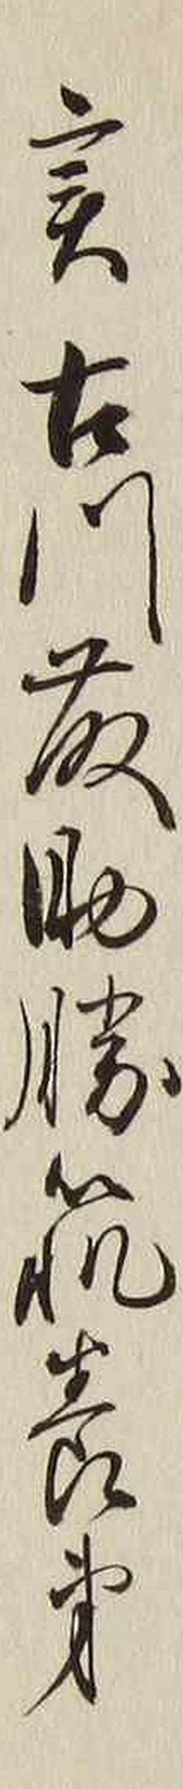実古川藤助勝筑養弟
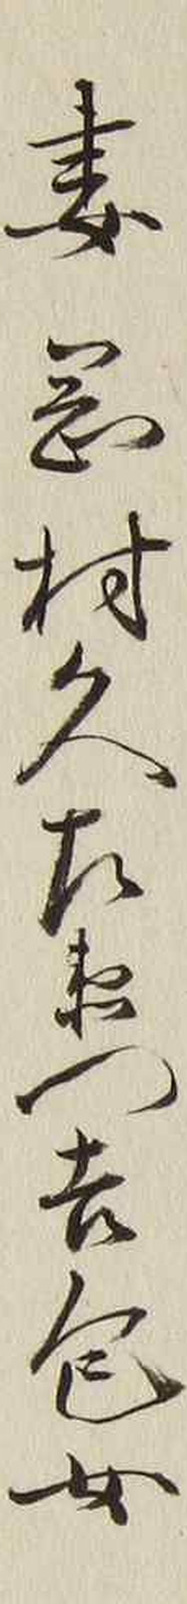妻岡村久左衛門吉包女
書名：諸士系譜　巻之163　な之部5
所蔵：会津若松市立会津図書館
